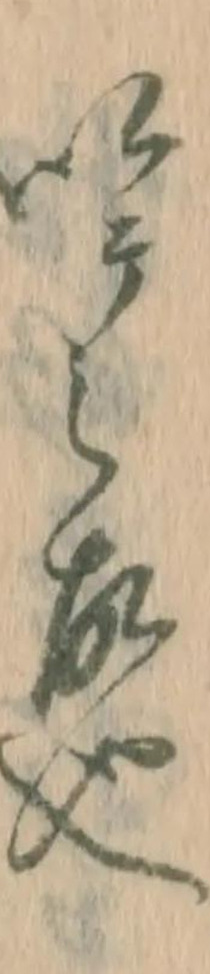以て之故也
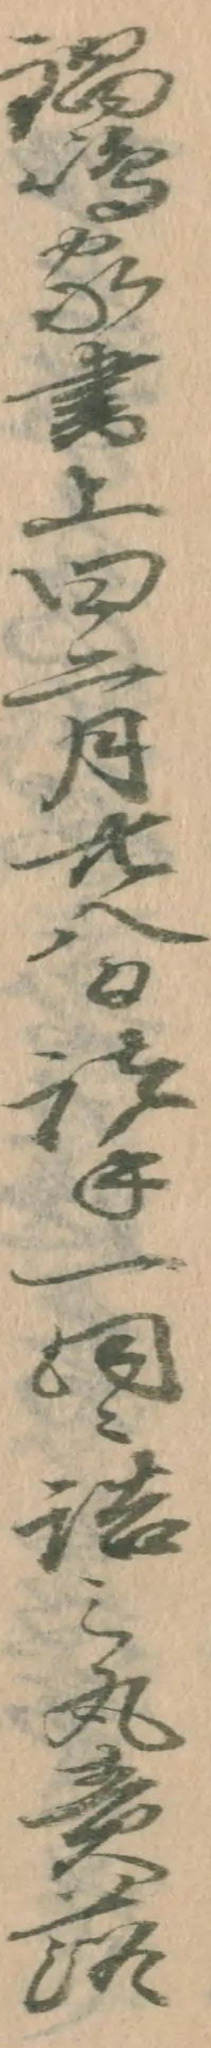鍋島家書上曰二月廿八日諸手一同に詰之丸責落
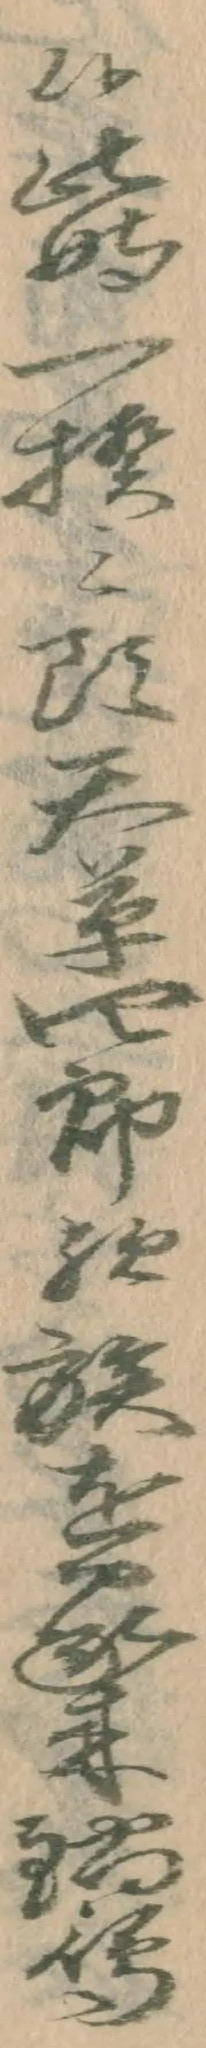候此時一揆之頭天草四郎歟旗を家来鍋島
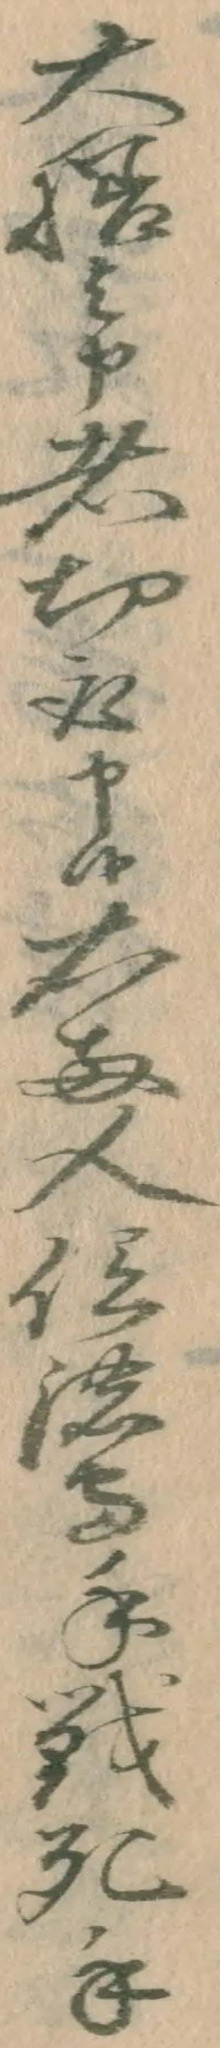大膳与申者切取申候右両人信濃守手戦死手
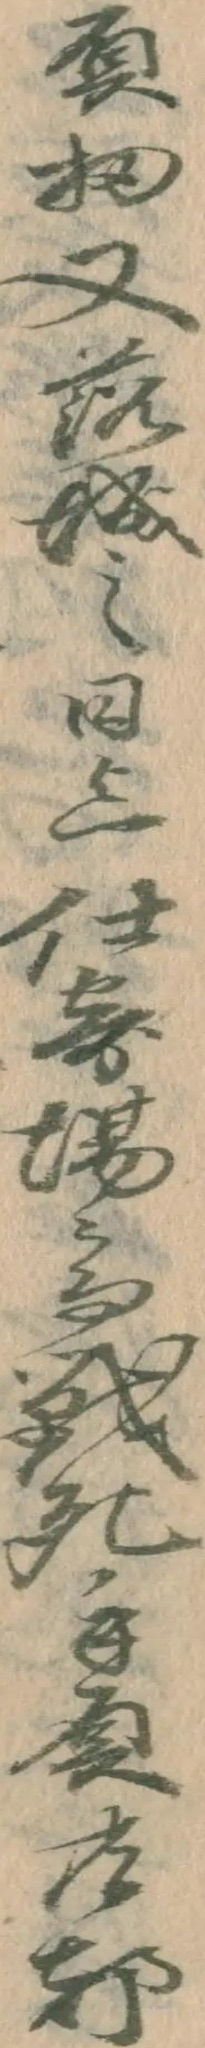負扨又落城之日迄仕寄場に而戦死手負共都
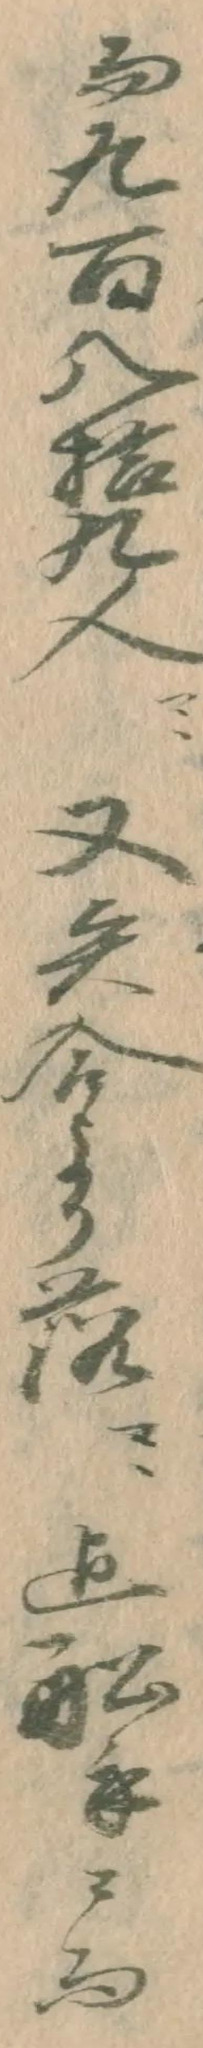而九百八拾九人又矢合より落迄舩手に而
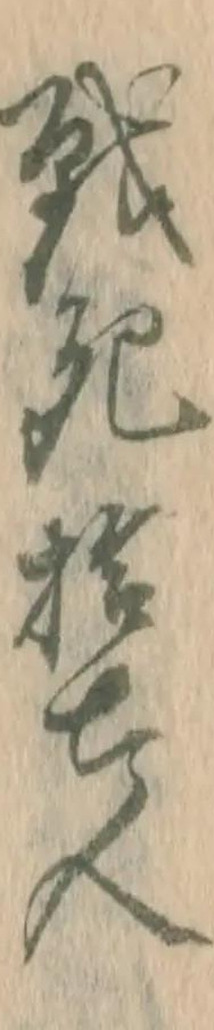戦死拾七人
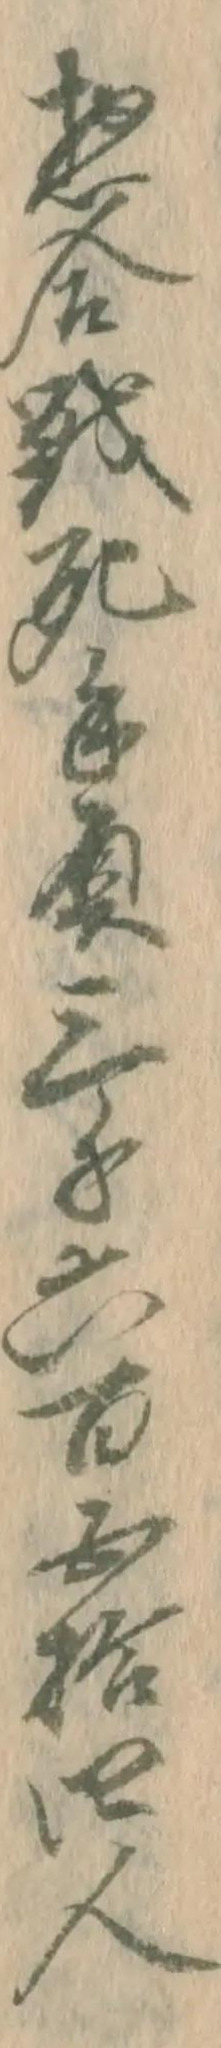惣合戦死手負三千六百五拾四人

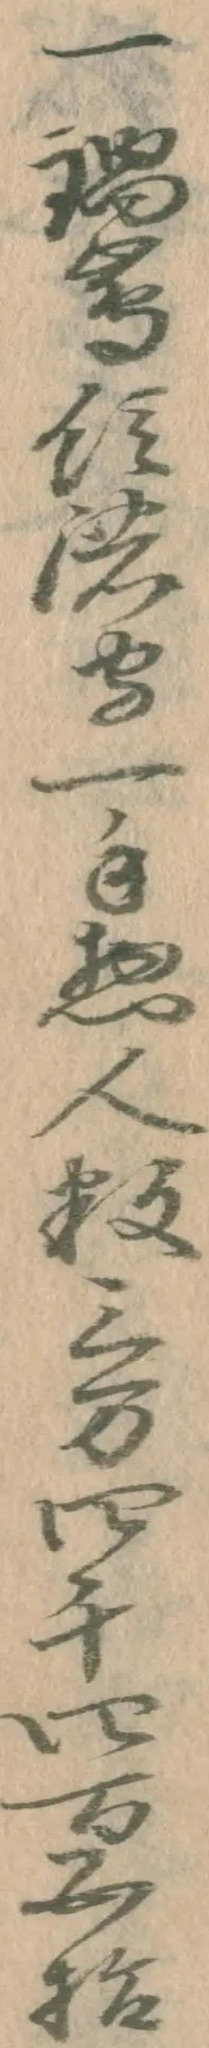一鍋島信濃守一手惣人数三万四千四百五拾
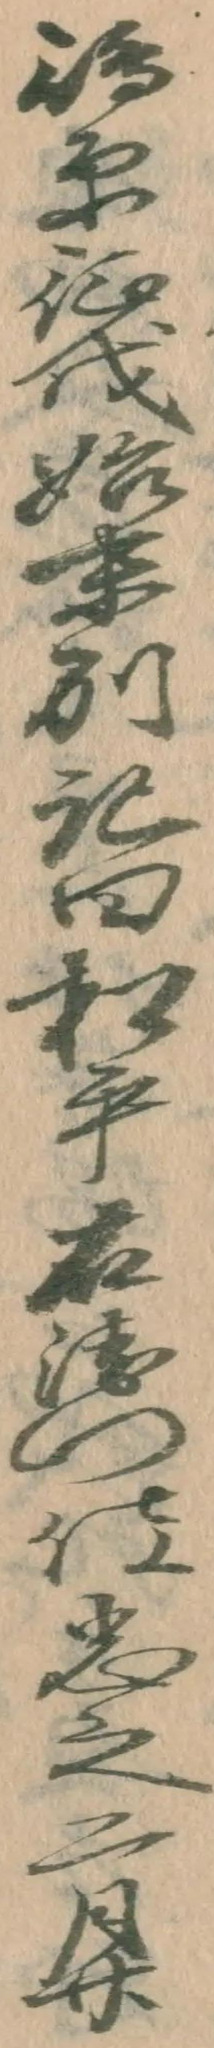島原征伐始末別記曰松平右衛門佐忠之二月廿
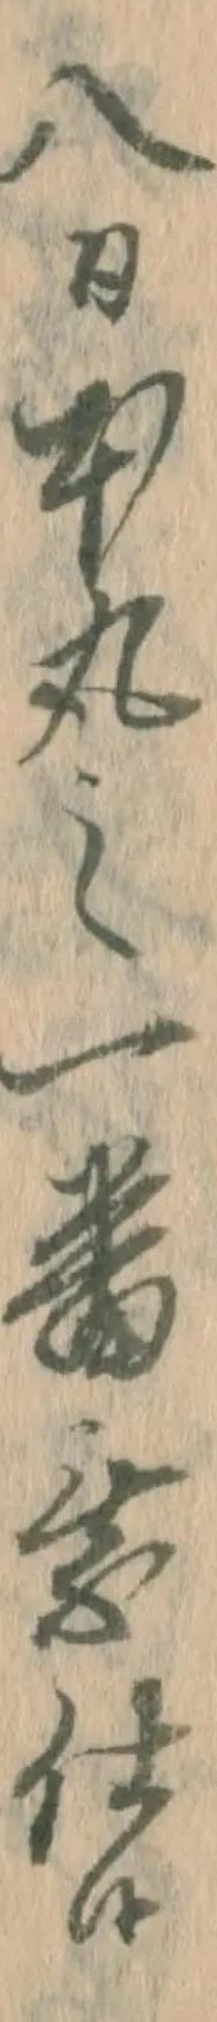八日本丸之一番乗仕候
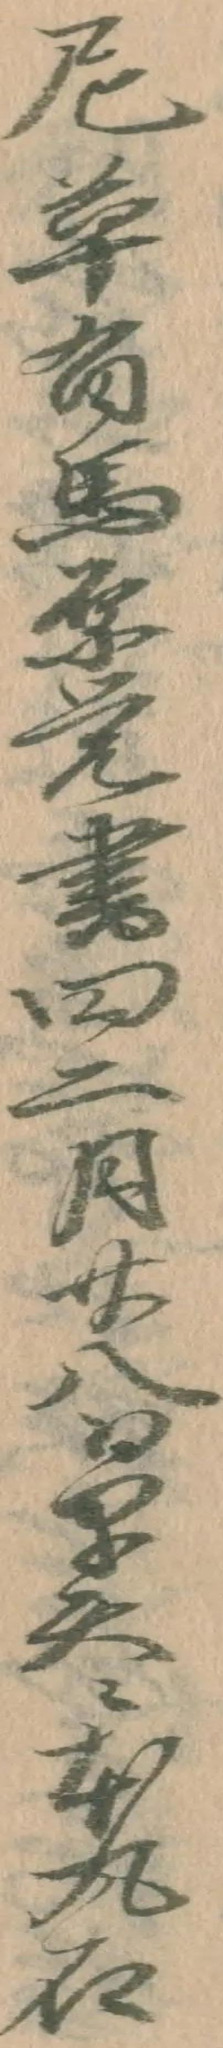尼草有馬原覚書曰二月廿八日早天に本丸石
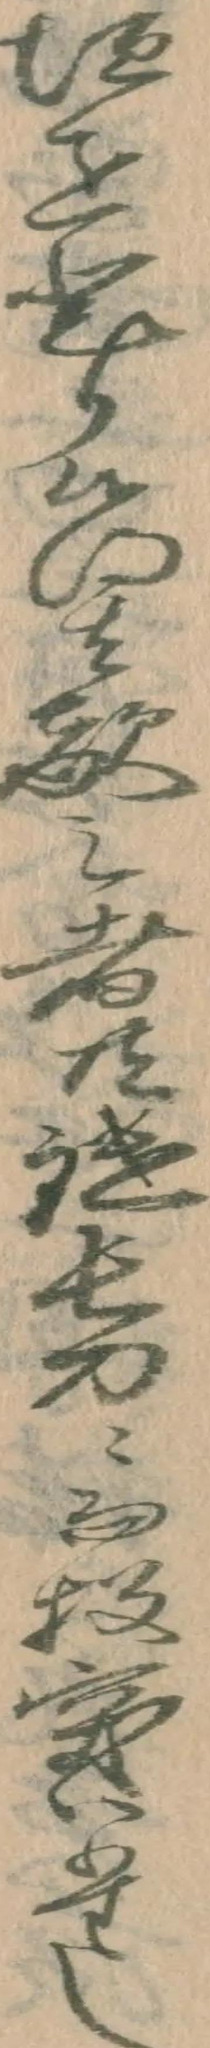垣を登り候得者敵之者共鑓長刀に而投突は堂し
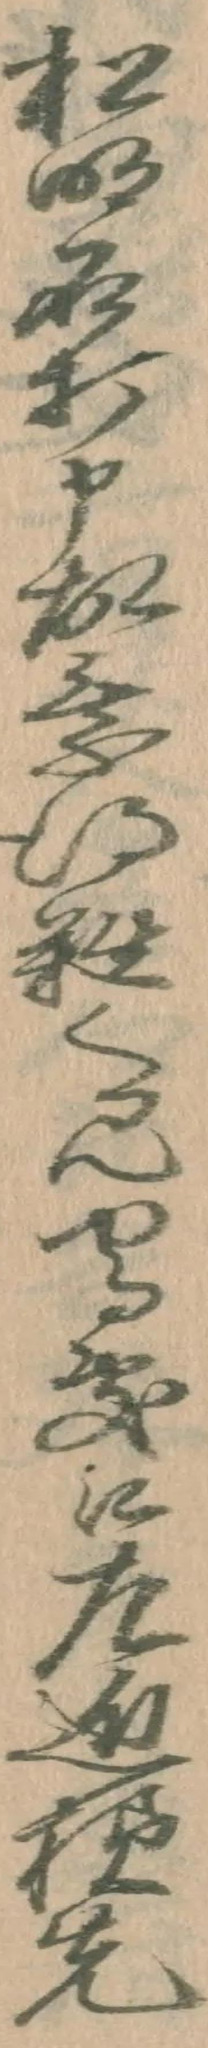松明石打申故乗得難く見ゆる處江左近様先
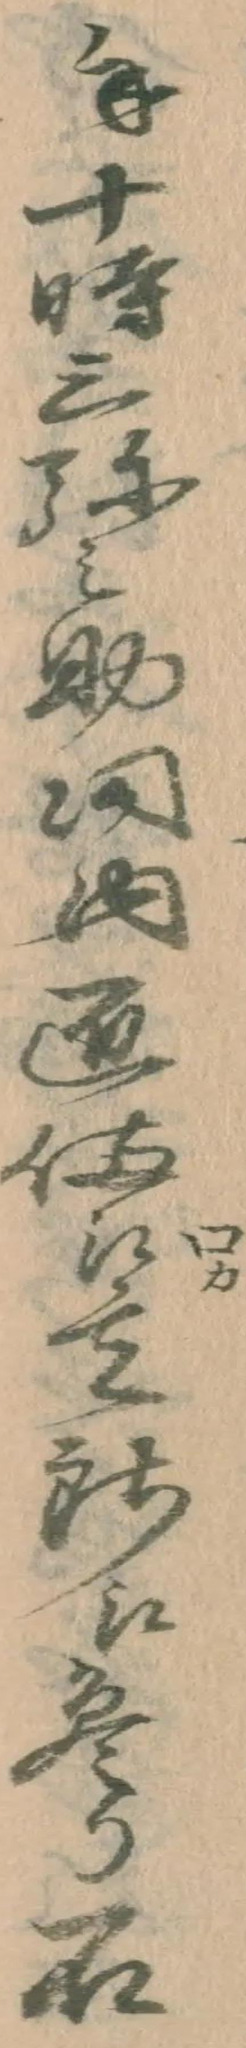手十時三弥之助同内匠備江其所江参り石
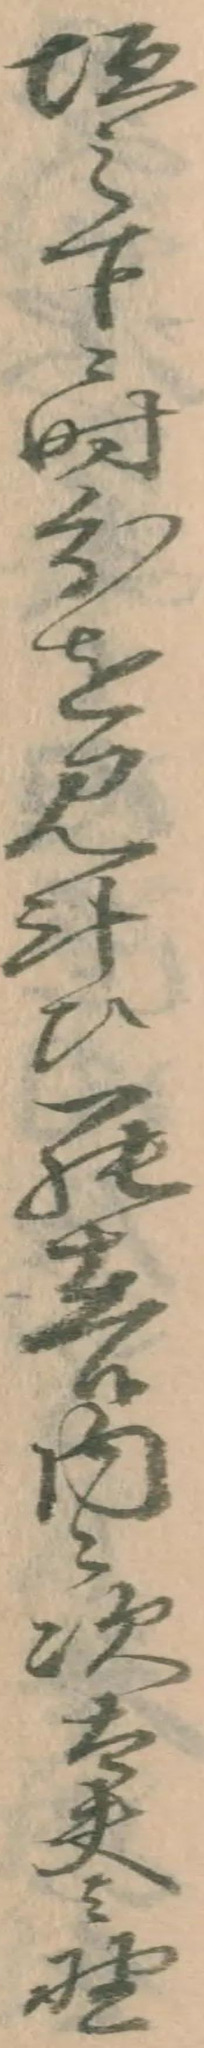垣之下に時分を見斗ひ罷在候内に次太夫与野
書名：切支丹御退治記 49巻. [8]
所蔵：国立国会図書館 National Diet Library, JAPAN
